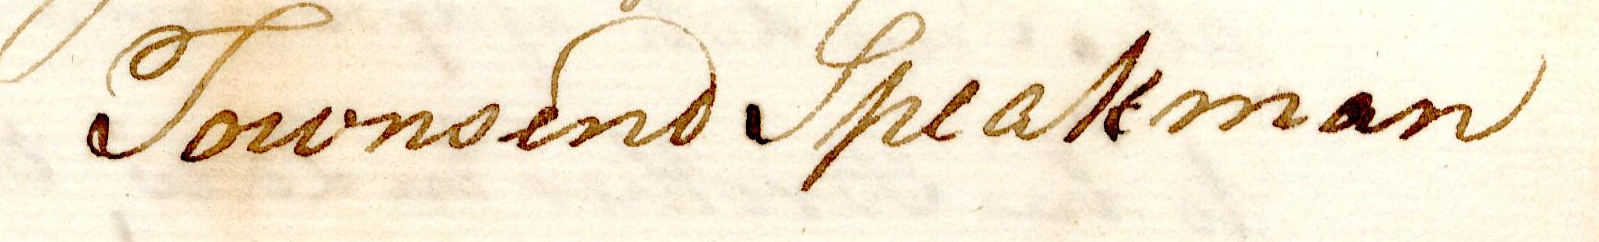Townsend Speakman
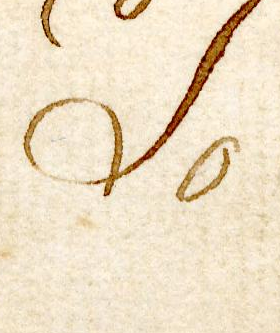To
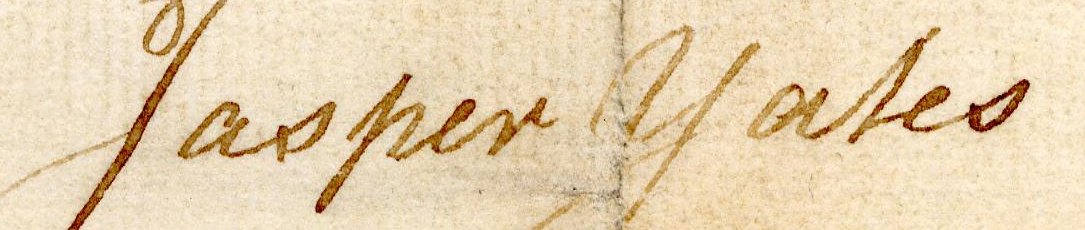Jasper Yates
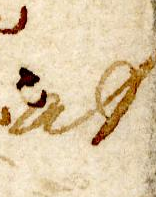at
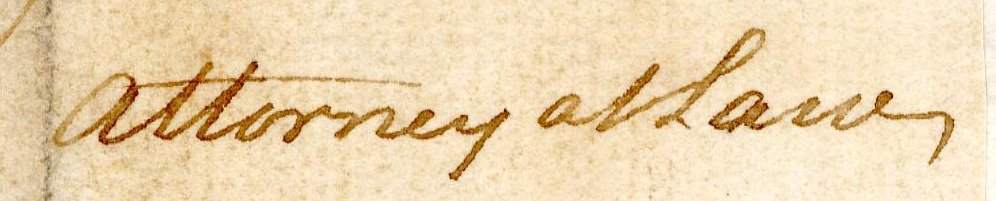Attorney at Law
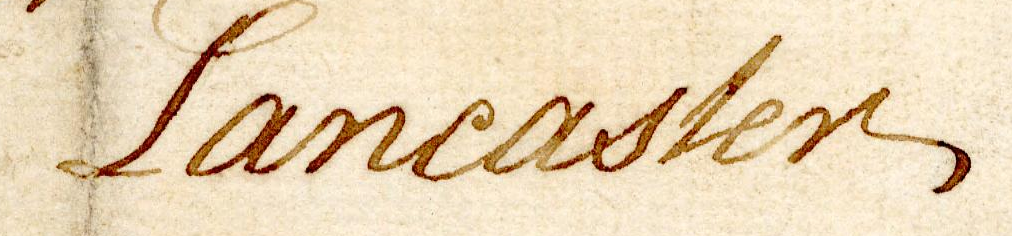Lancaster
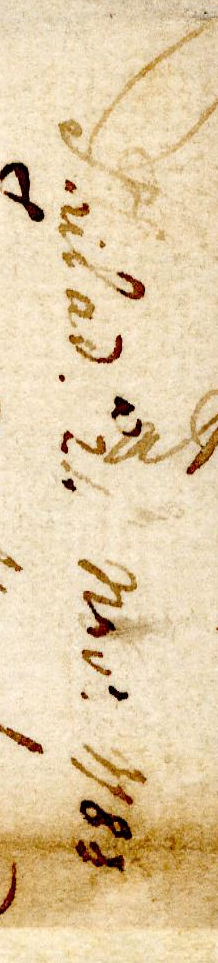Phlad^a. 2. Nov^r. 1783
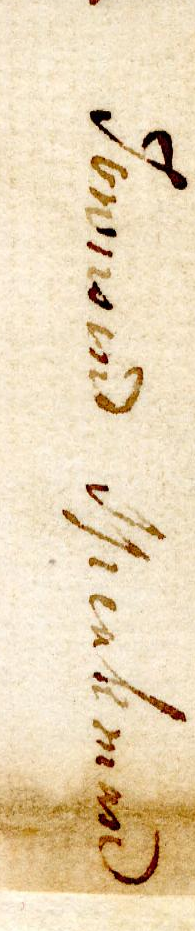Townsend Speakman
